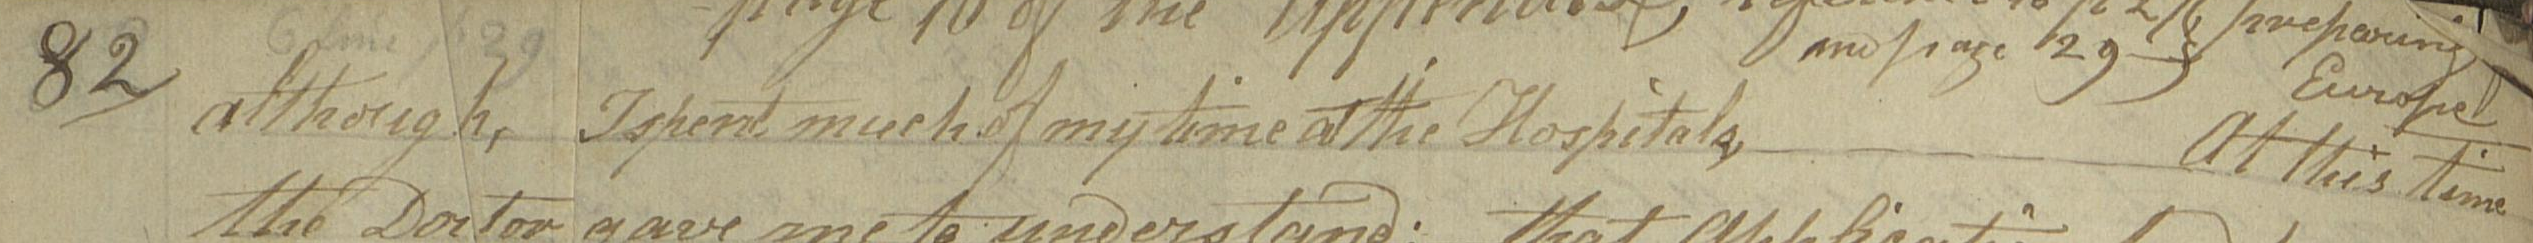82 although, I spent much of my time at the Hospitals, At this time
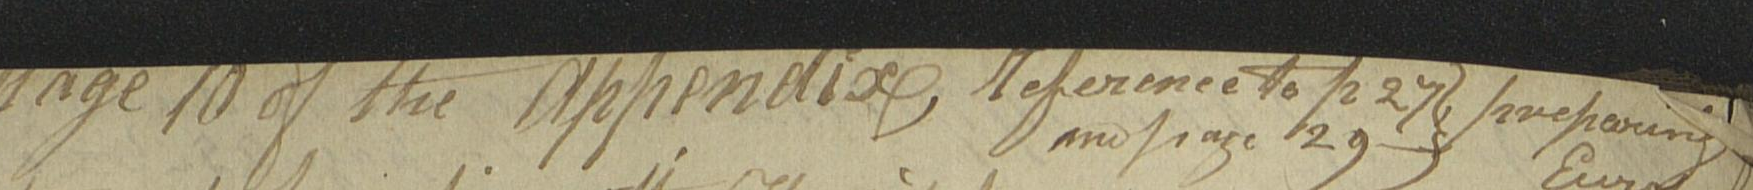page 10 of the Appendix, Reference to p 27 preparing
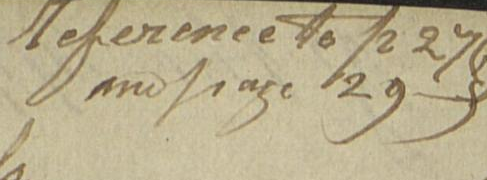and page 29
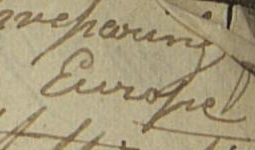Europe
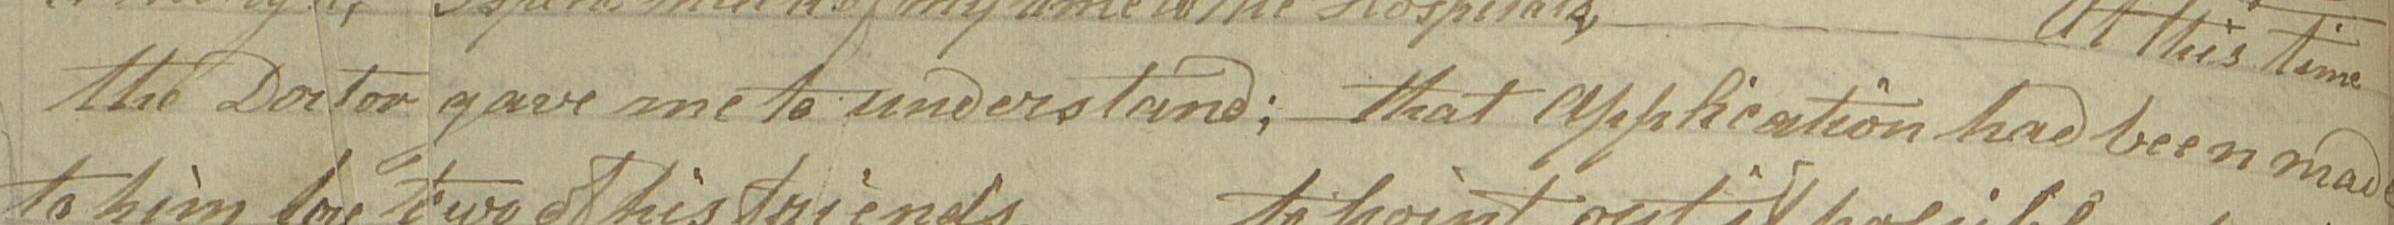the Doctor gave me to understand; that Application had been made
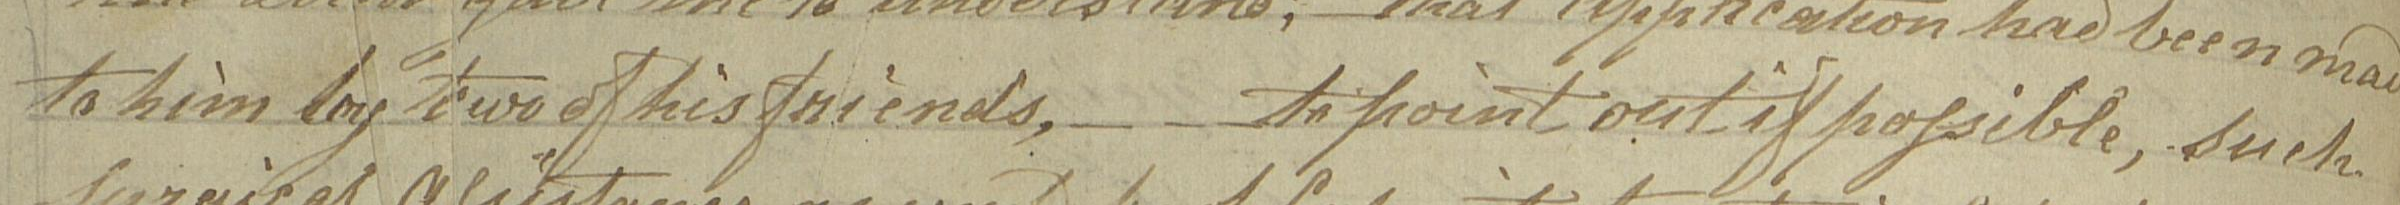to him by two of his friends, to point out if possible, such
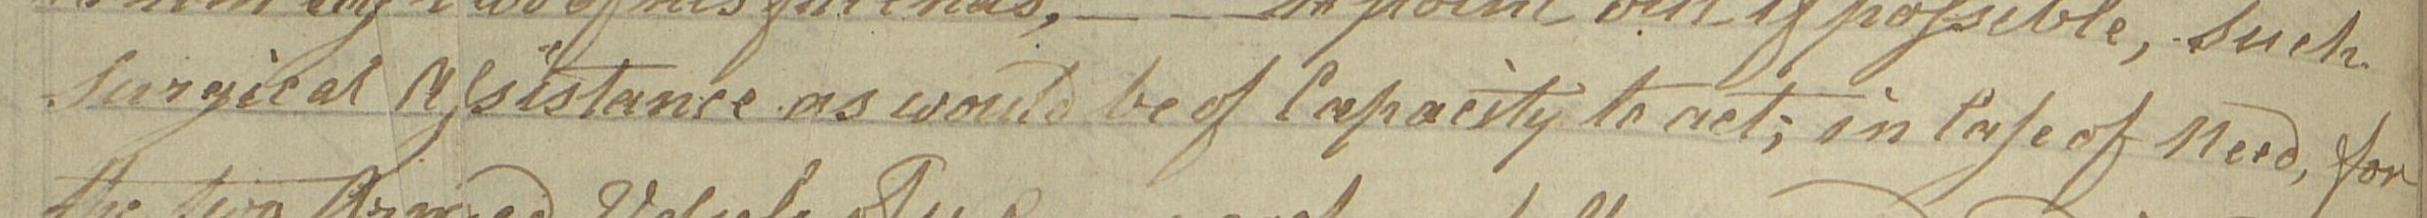Surgical Assistance as would be of Capacity to act; in Case of Need, for
